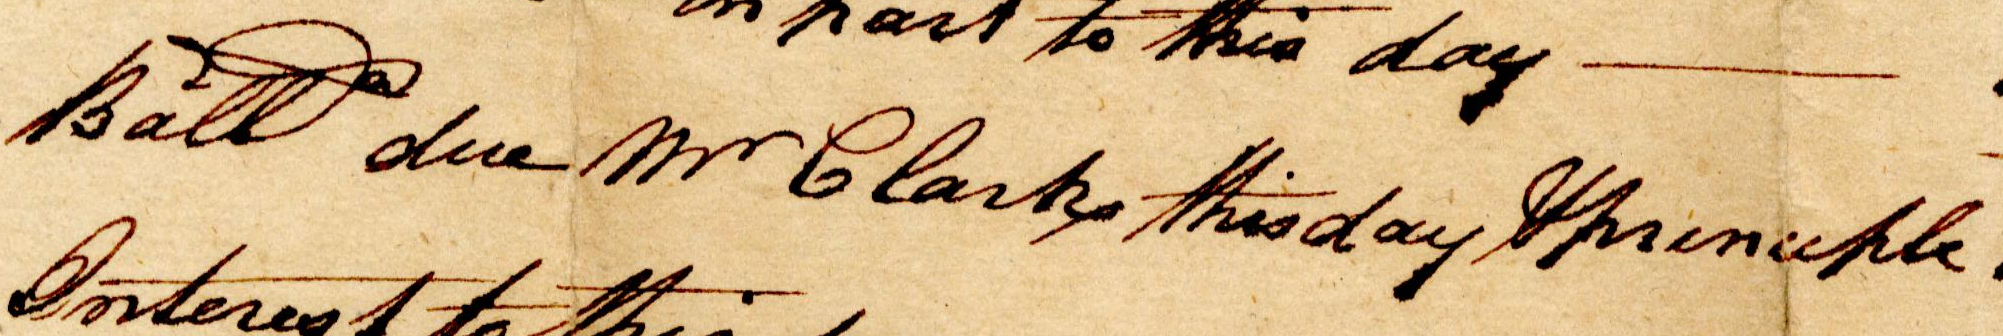Ball^ce due M^r Clark this day & principle
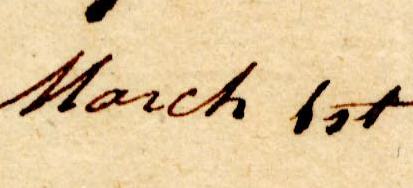March 1st
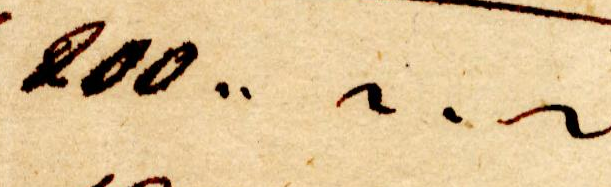200..-.-
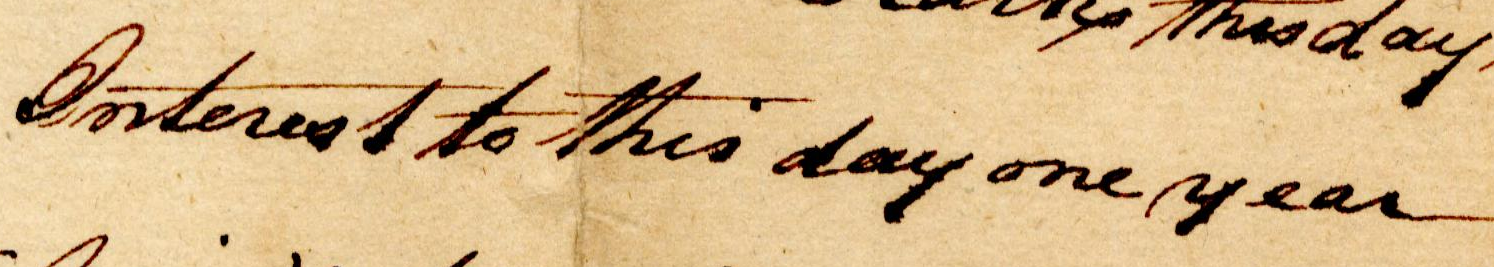Interest to this day one year-
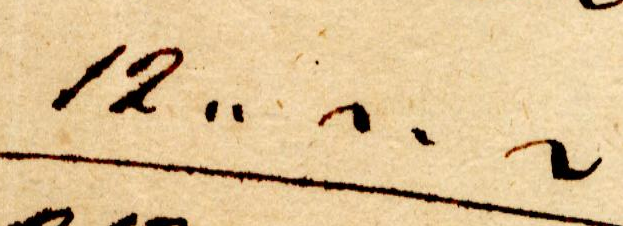12..0.0
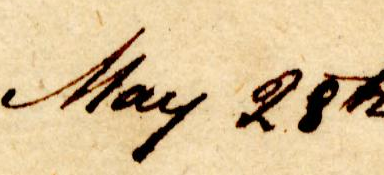May 28^th
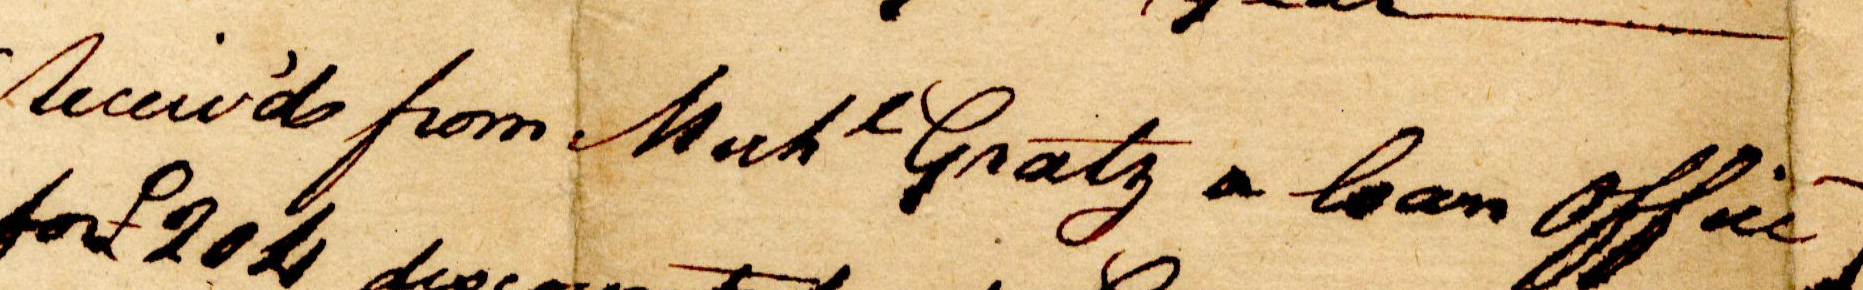Receiv^d from Mich^l Gratz a can office
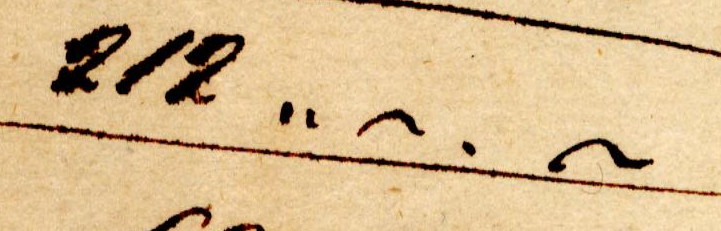212..0..0
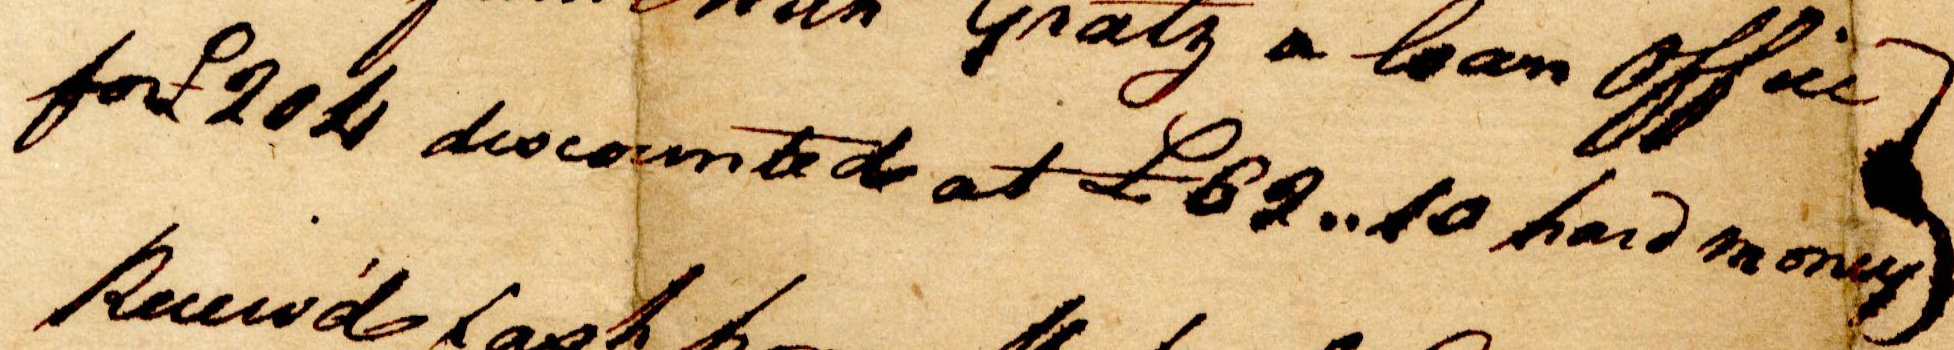for £204 discounted at £62..10 hand money
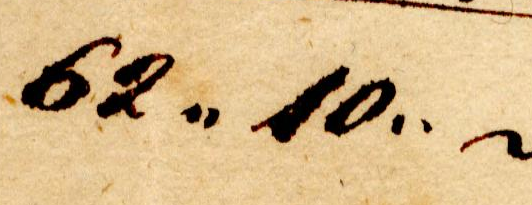62.. 10..-
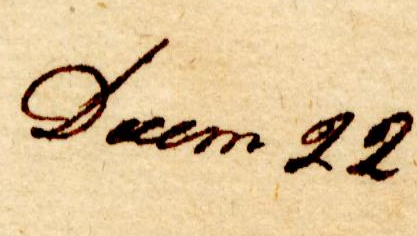Decem 22
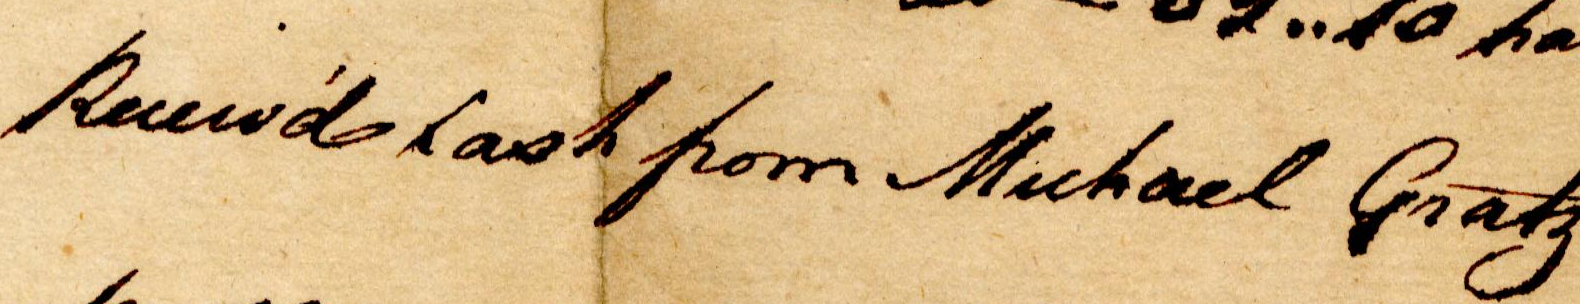Receivd cash from Michael Gratz
